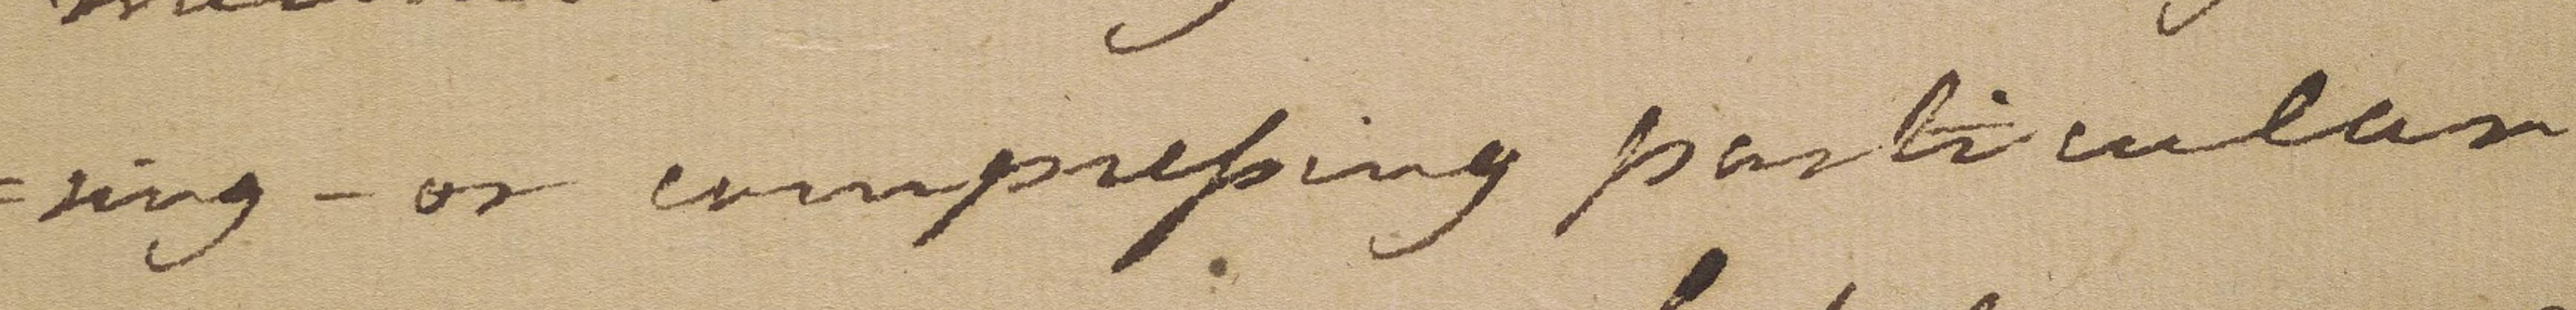-sing- or compressing particular
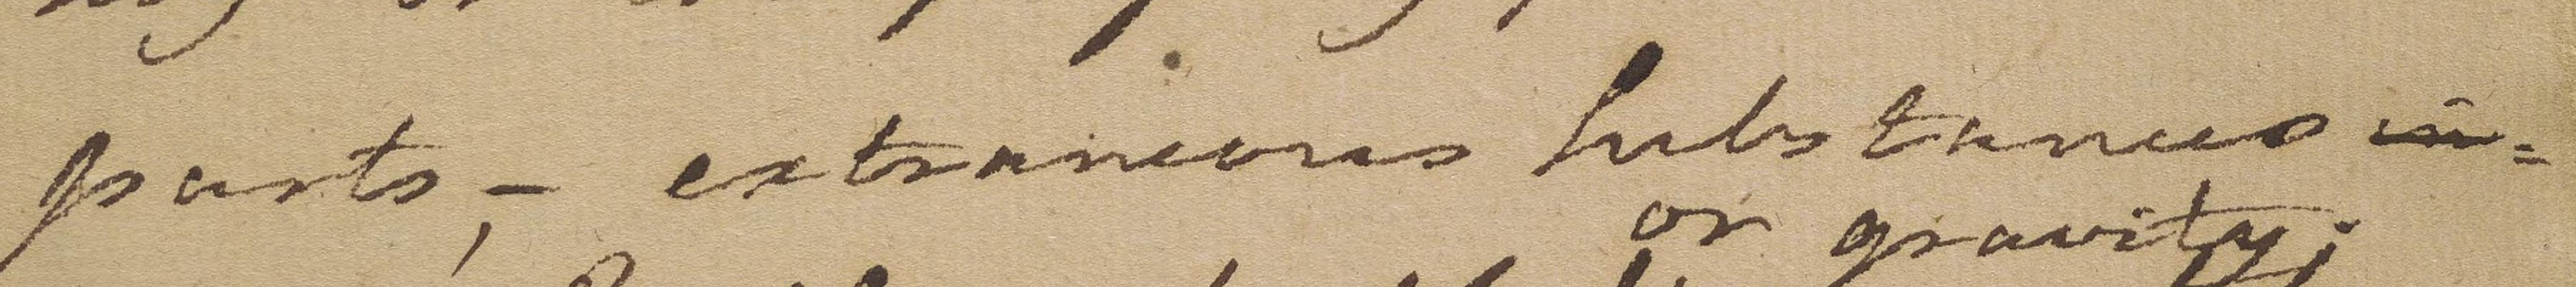parts, extreneous substances in
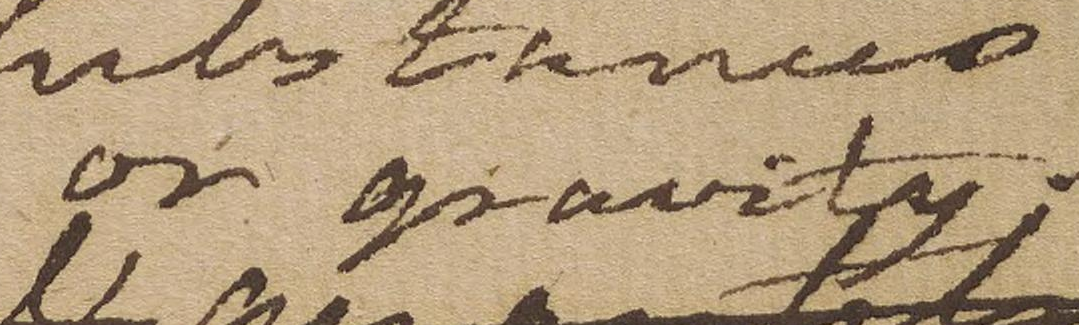or gravity
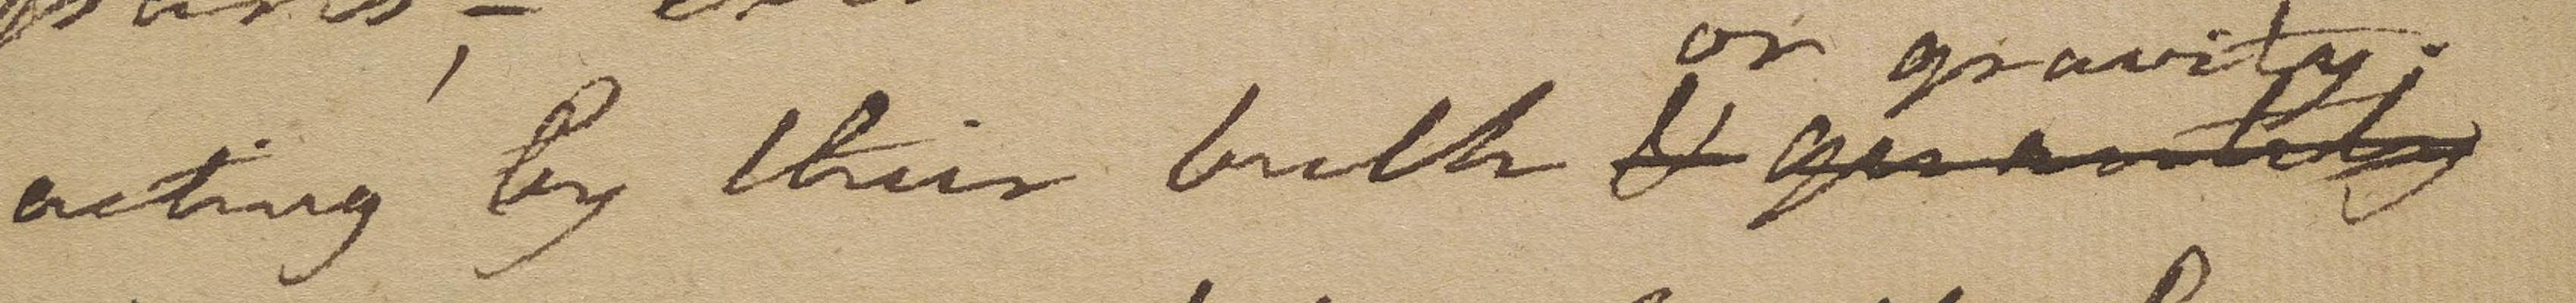acting by their bulk [& quantity]
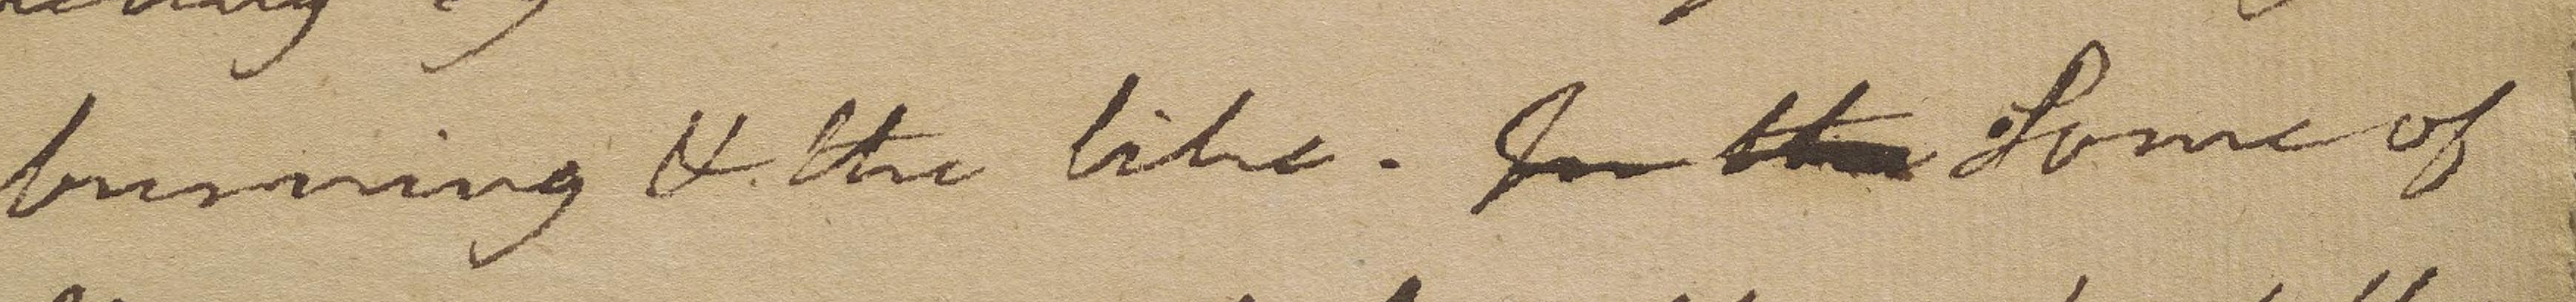burning & the like. [In] [the] Some of
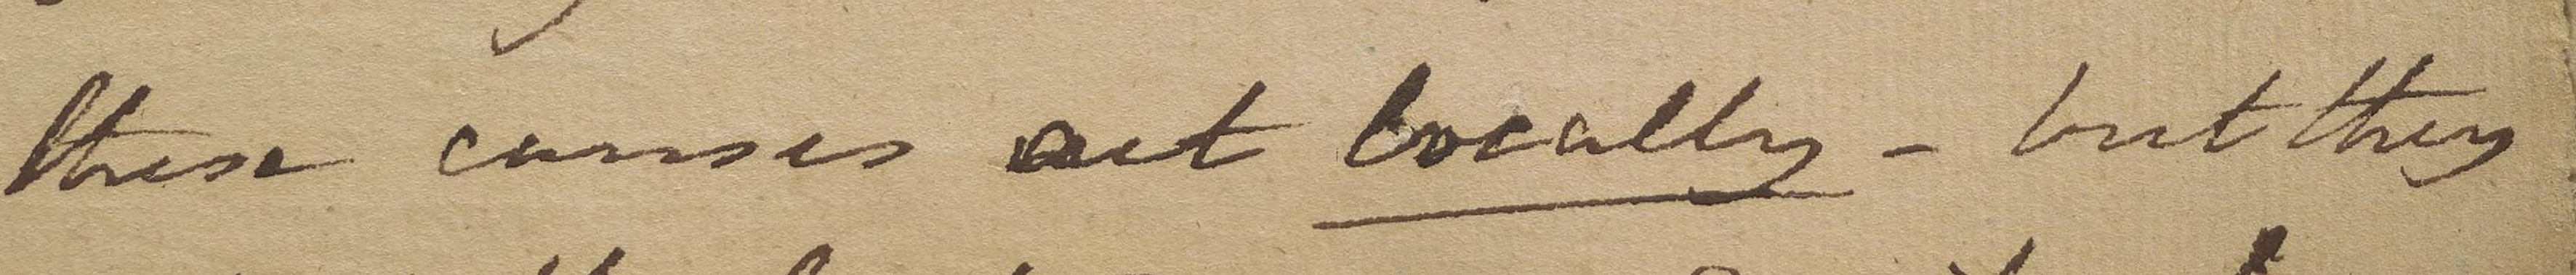these causes act locally, but they
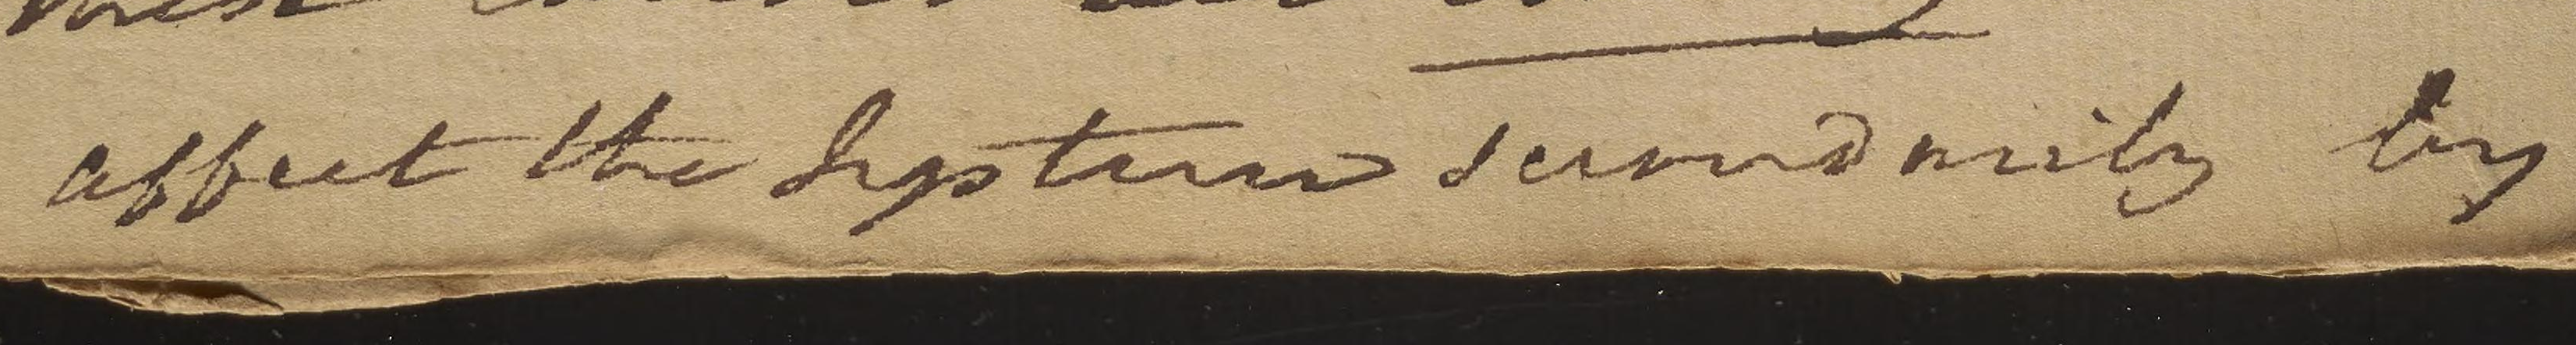affect the system secondarily by
